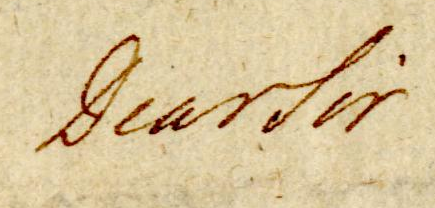Dear Sir
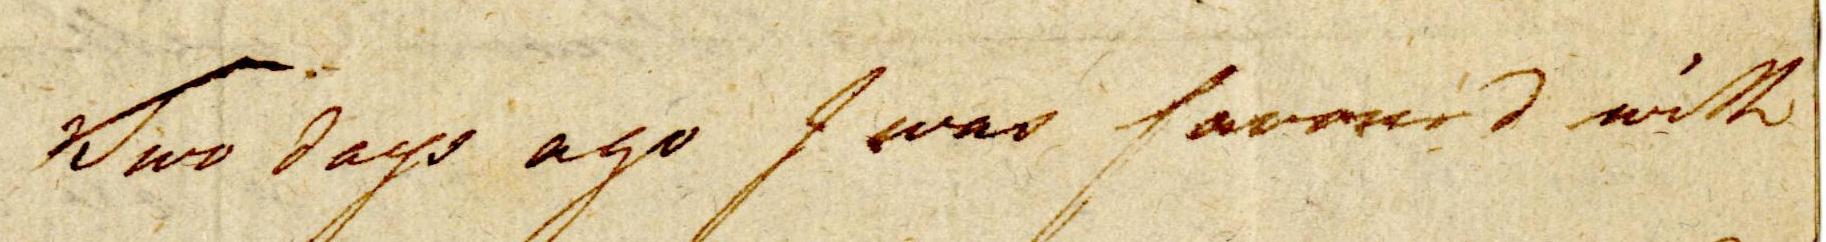Two days ago I was favour'd with
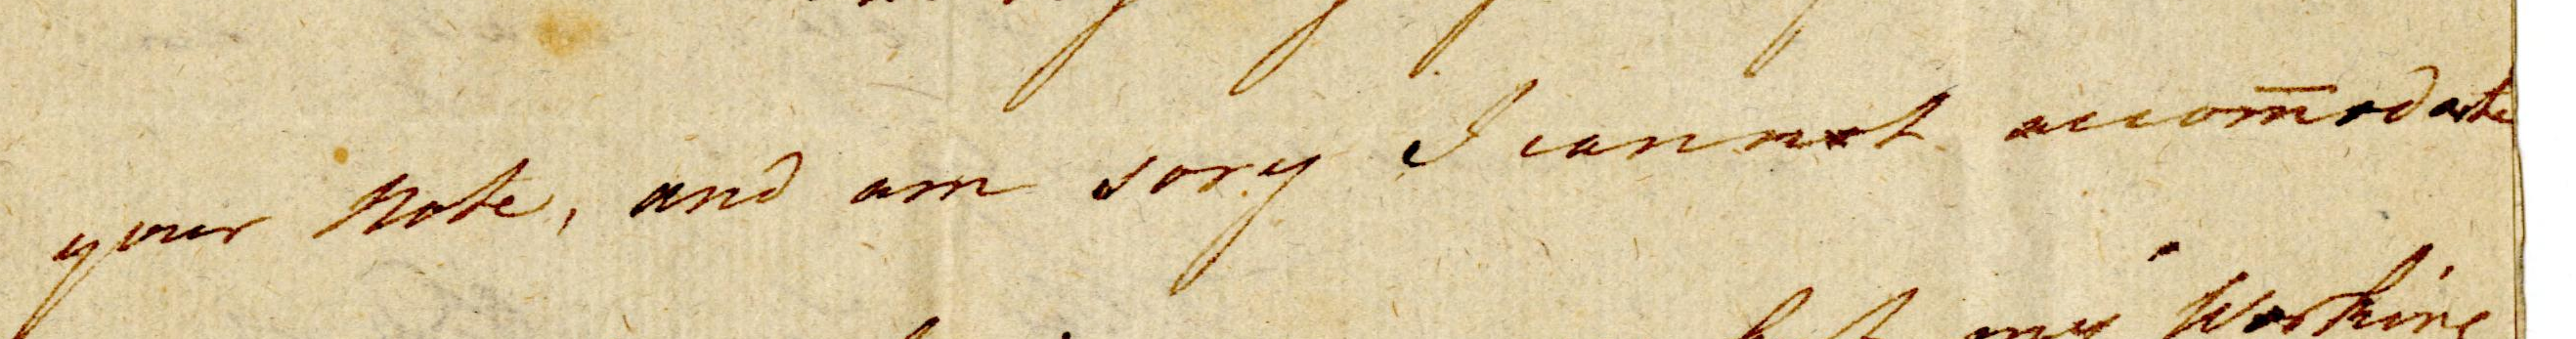your Note, and am sory I cannot accom̄odate
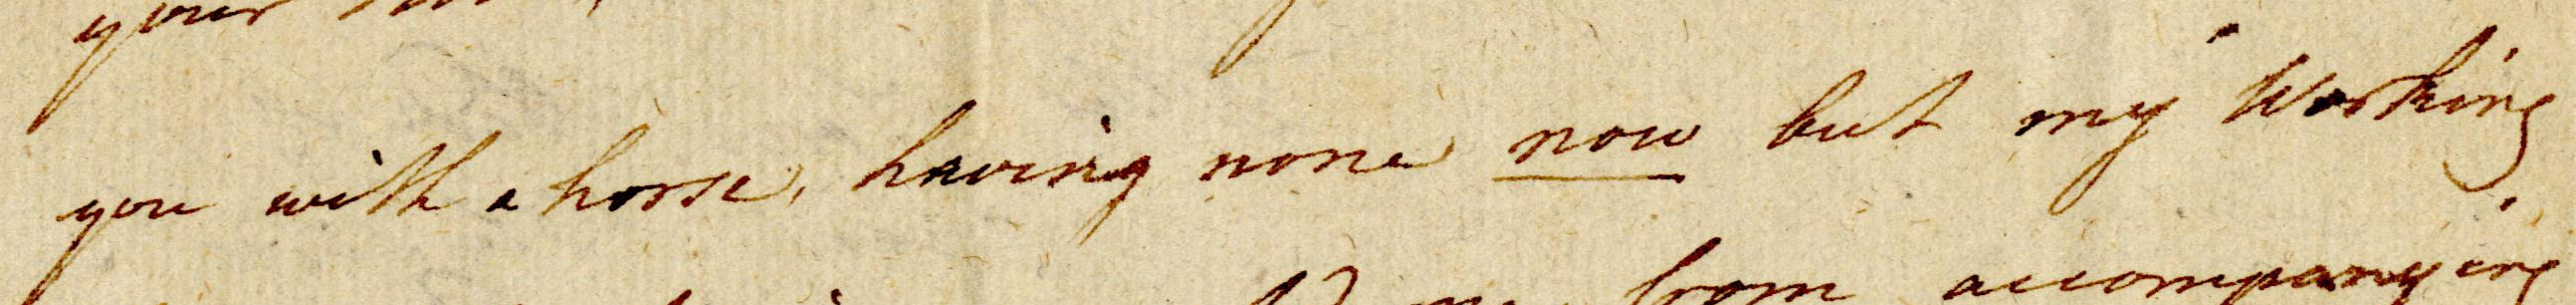you with a horse having none now but my Working
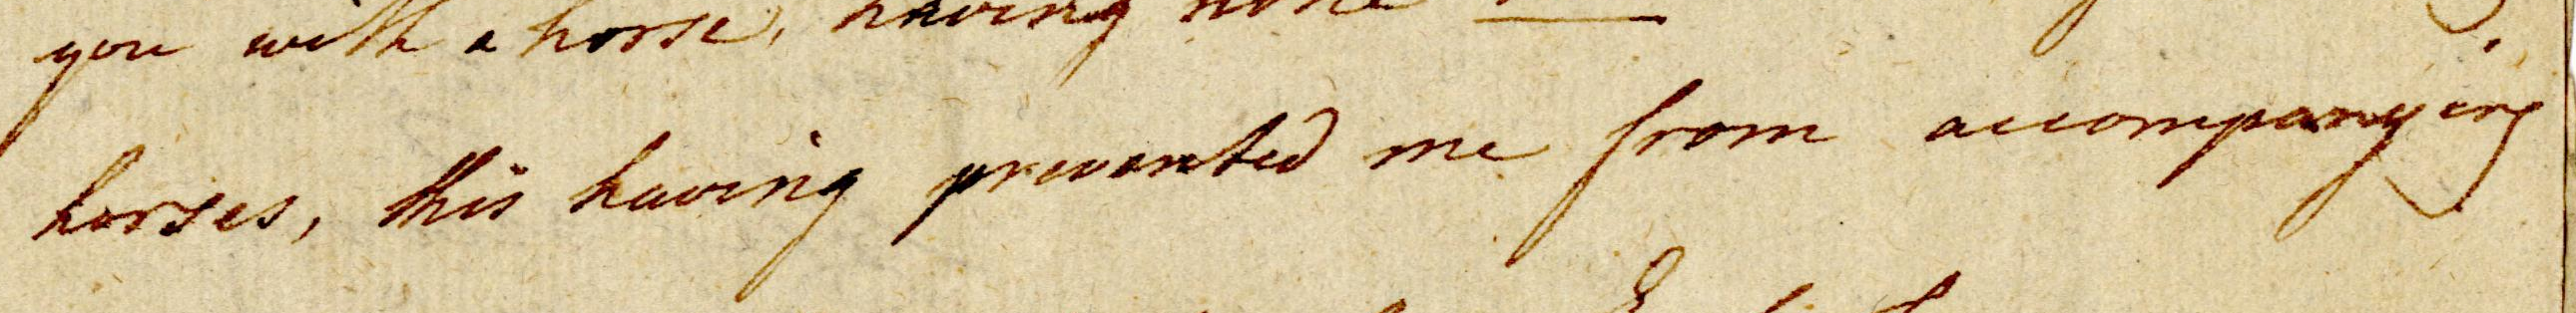horses, this having prevent'd me from accompanying
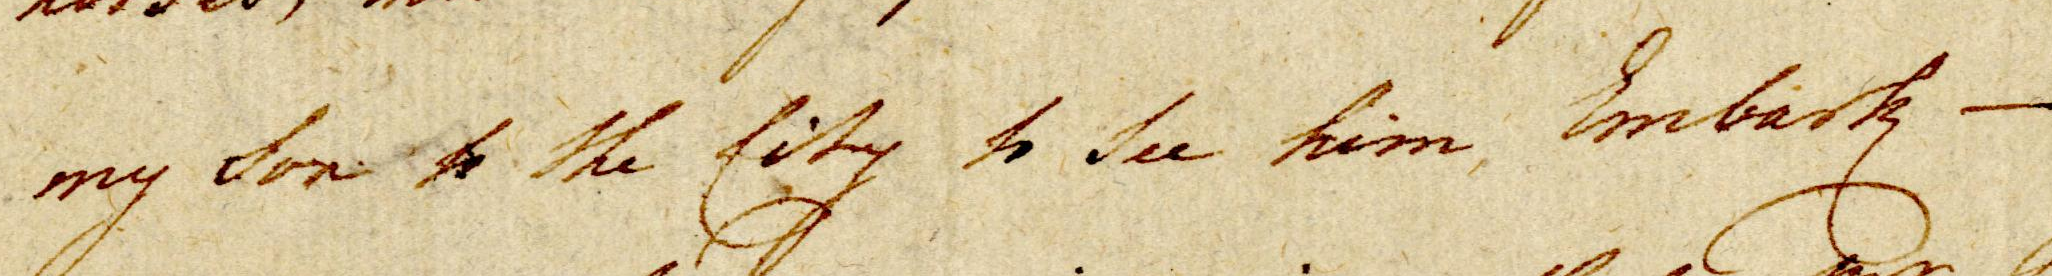my son to the City to see him Embark-
